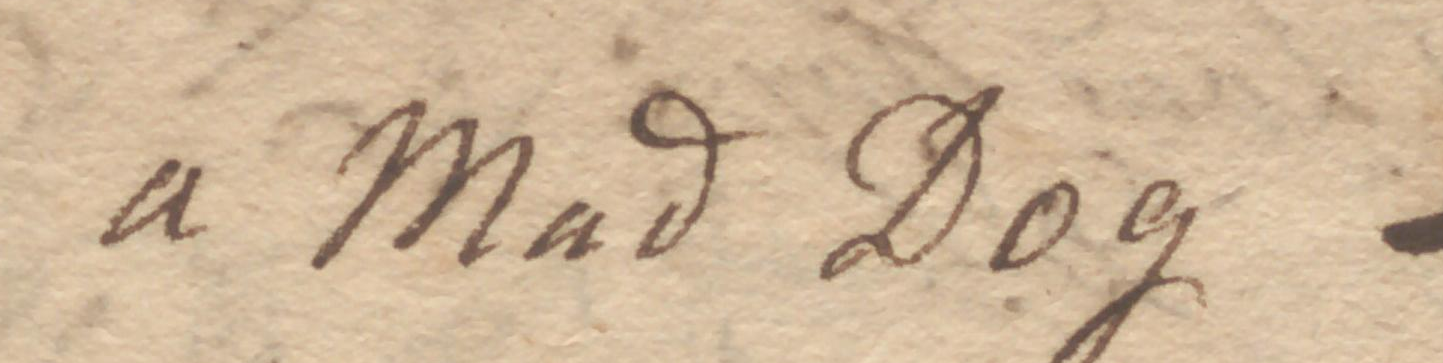a Mad Dog
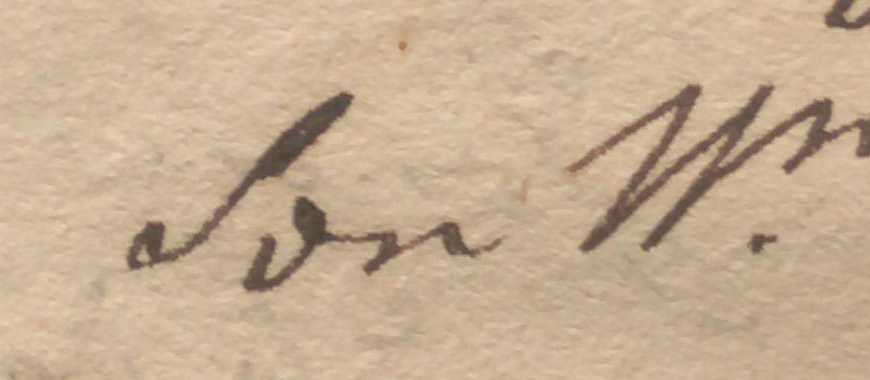Son W^m.
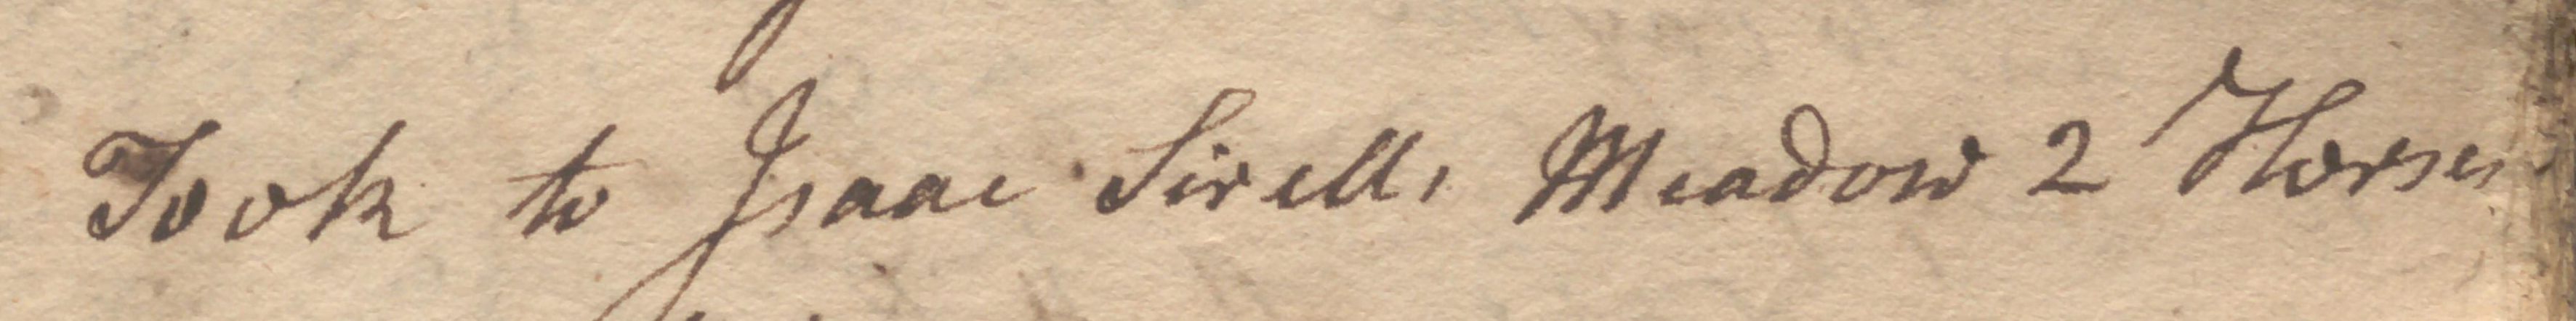Took to Isaac Sirells Meadow 2 Horses
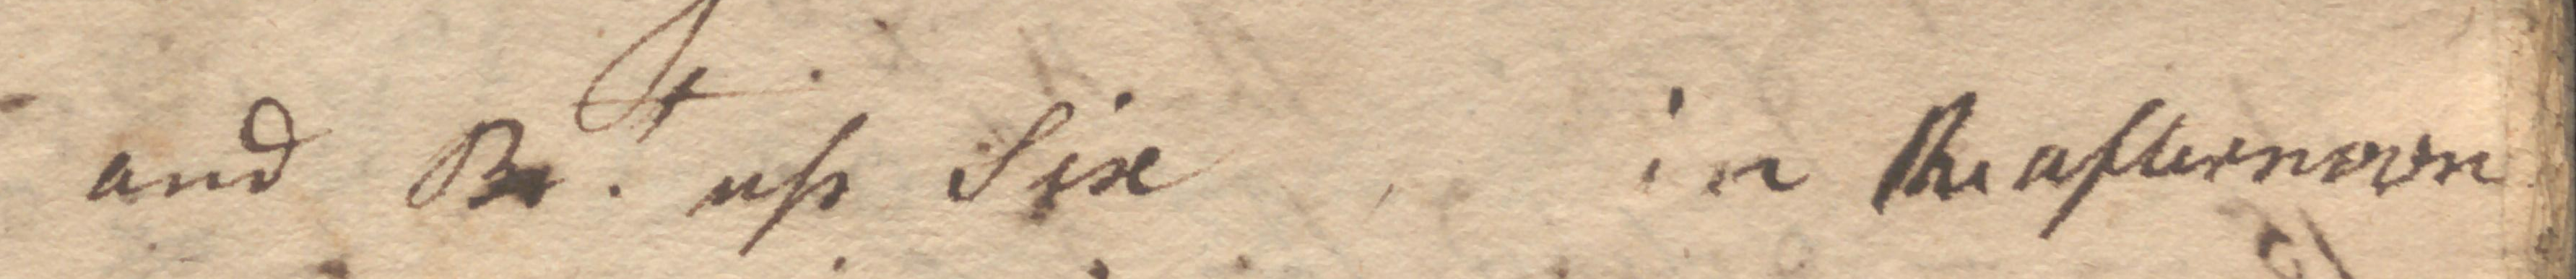and Br^t. up Six in the afternoon
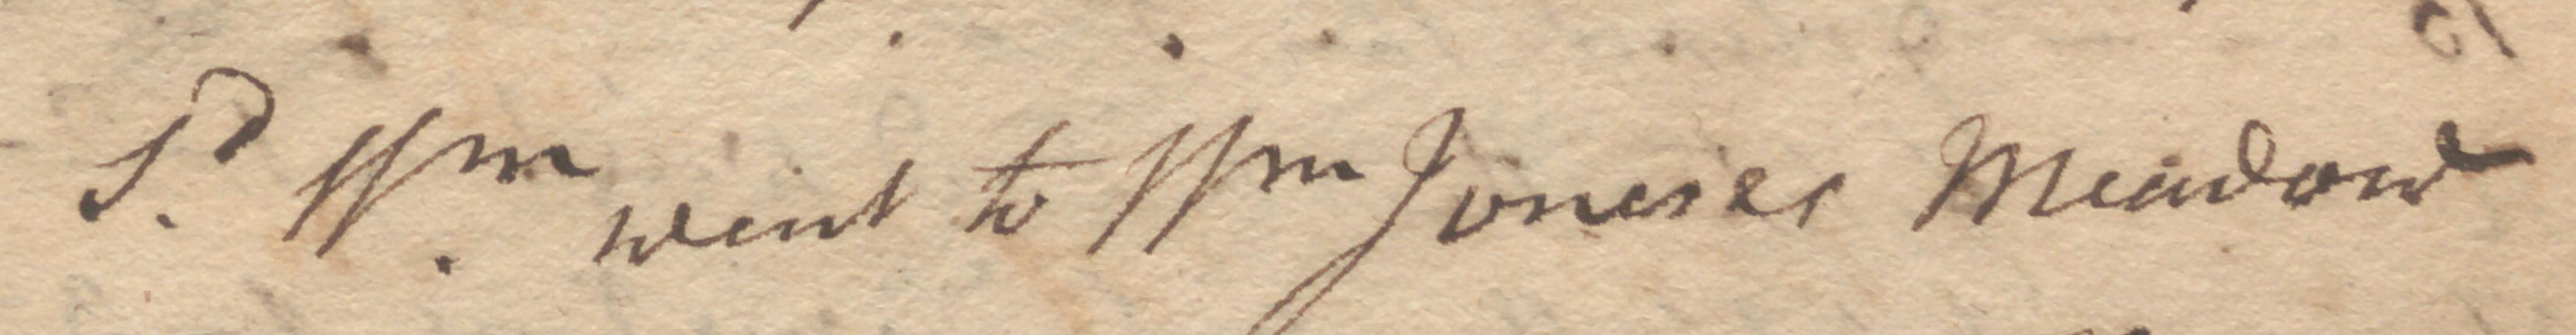s^d W^m. went to W^m Joneses Meadow
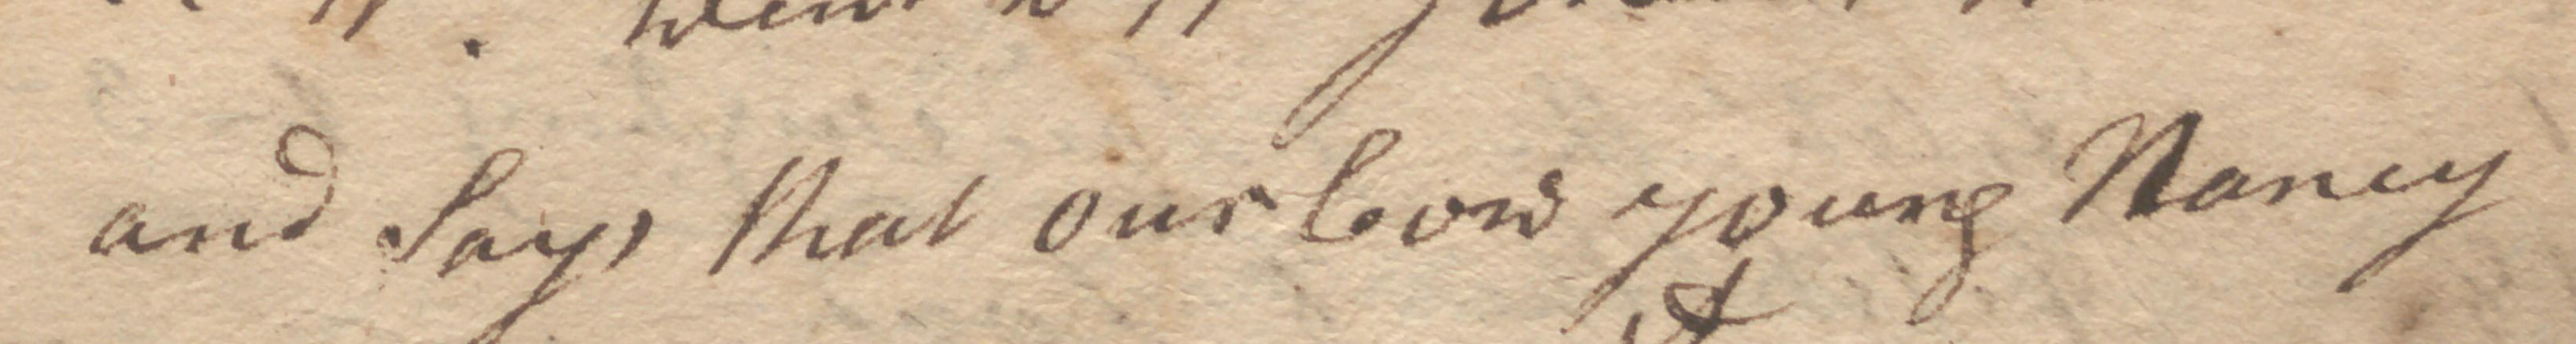and says that our Cow young Nancy
